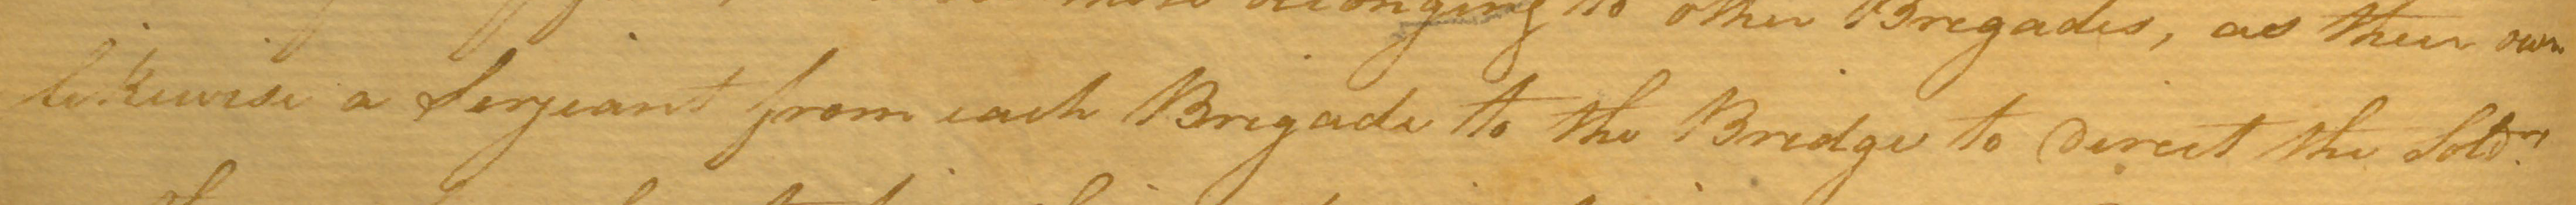likewise a Serjeant from each Brigade to the Bridge to direct the Sold^rs.
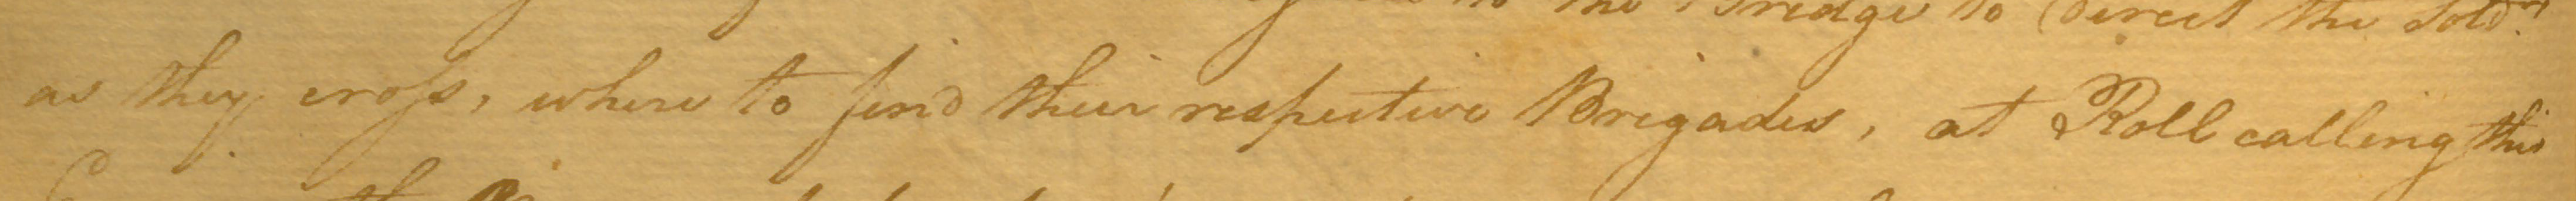as they cross, where to find their respective Brigades, at Roll calling this
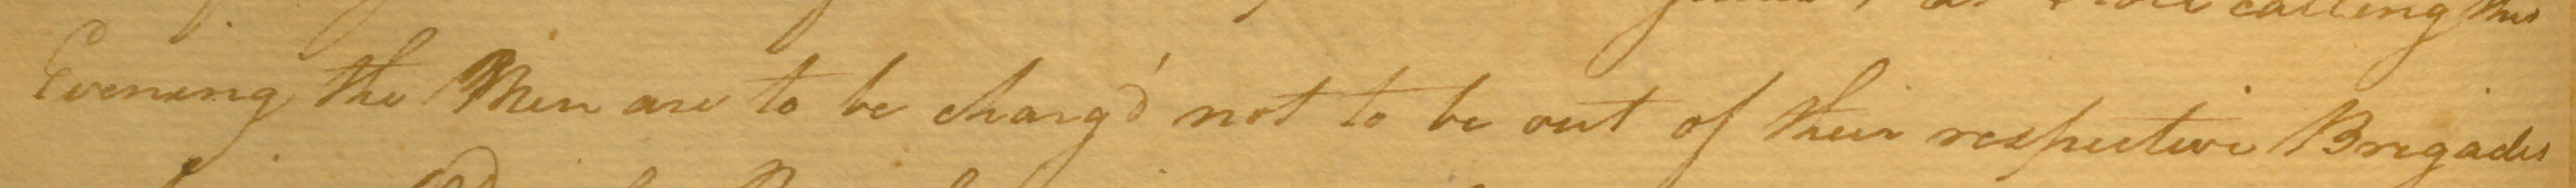Evening the Men are to be charg'd not to be out of their respective Brigades
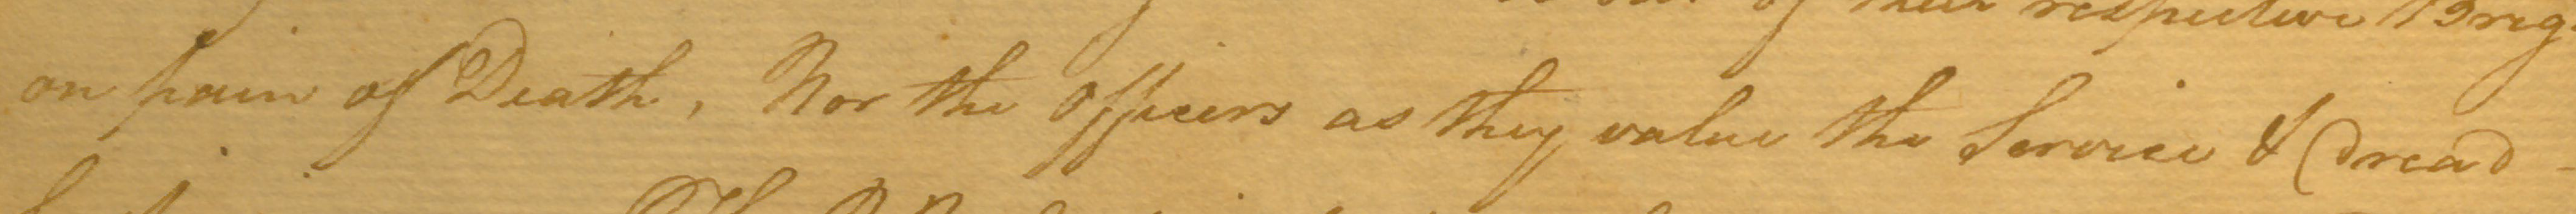on pain of Death. Nor the officers as they value the Service & dread
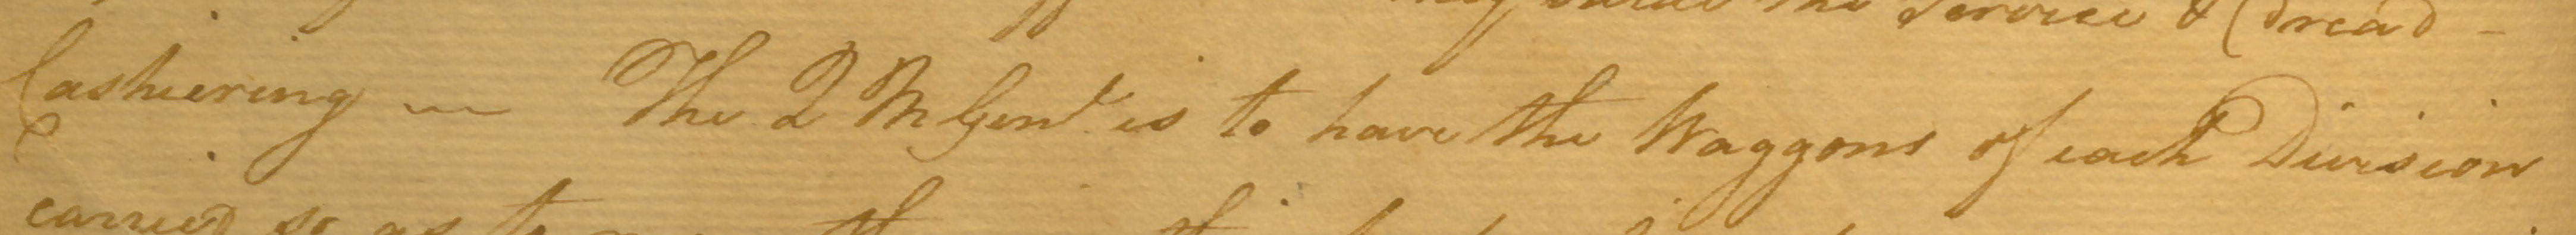Cashiering- The Q M Gen^l. is to have the Waggons of each Division
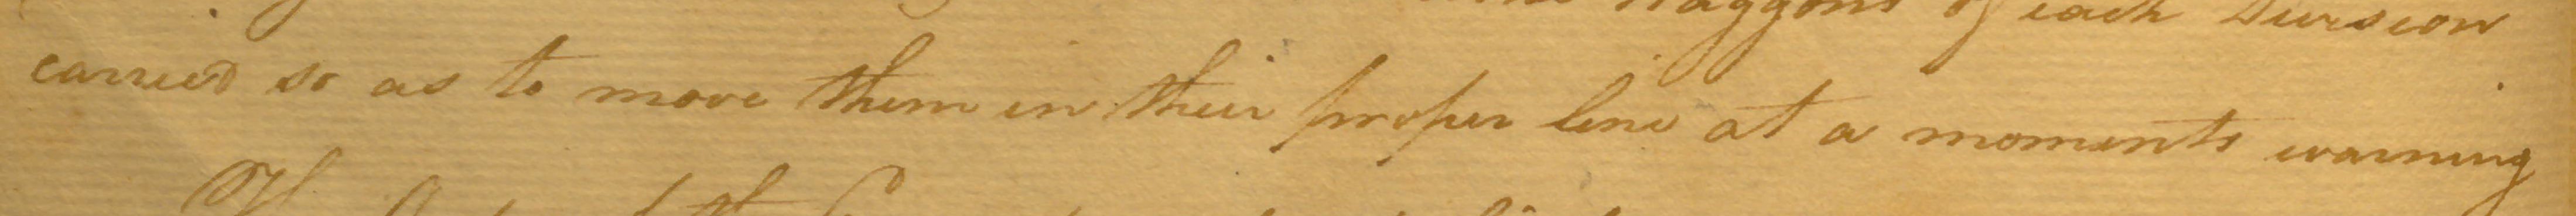carried so as to move them in their proper line at a moments warning
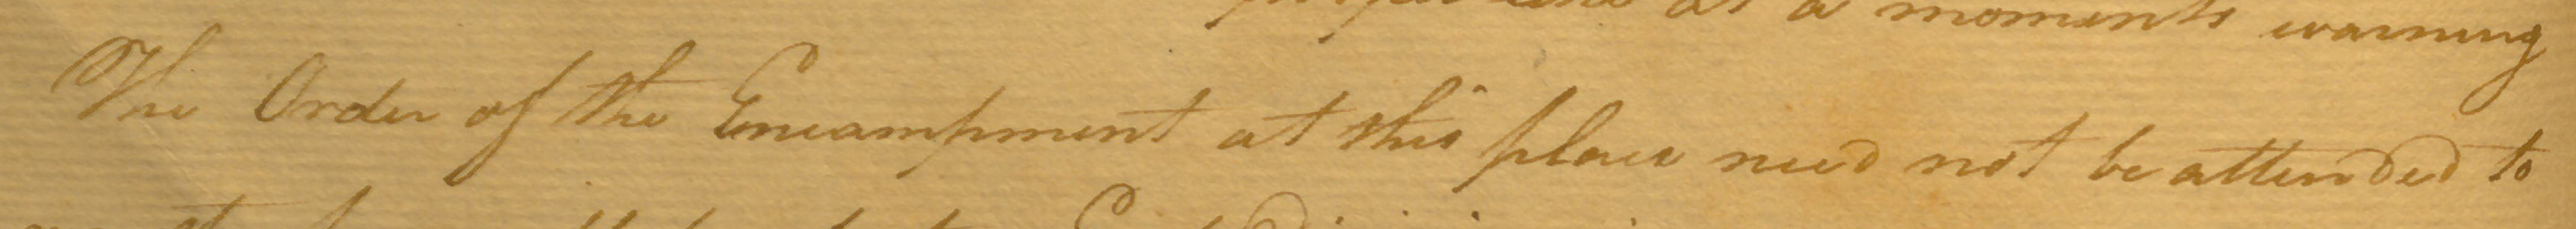The Order of the Encampment at this place need not be attended to
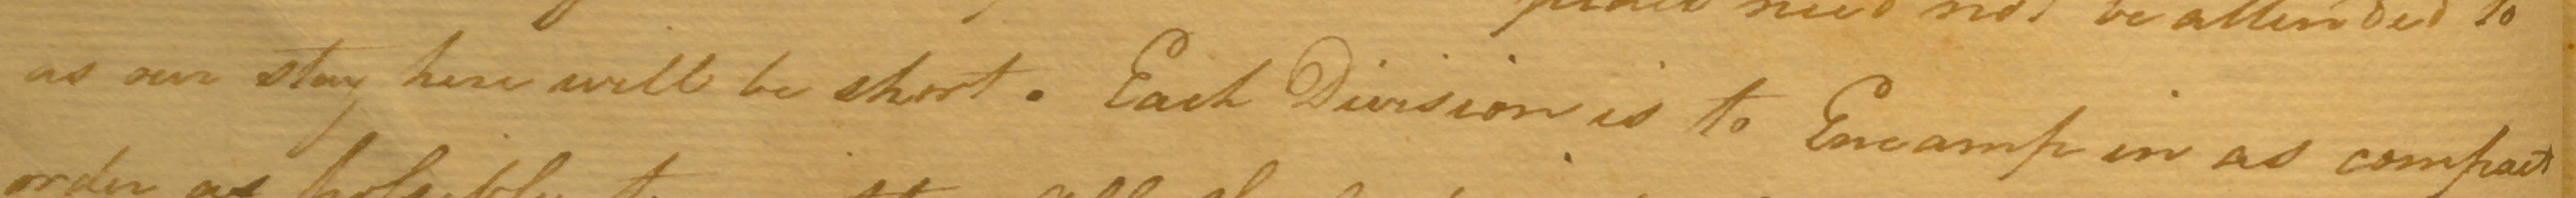as our stay here will be short. Each Division is to Encamp in as compact
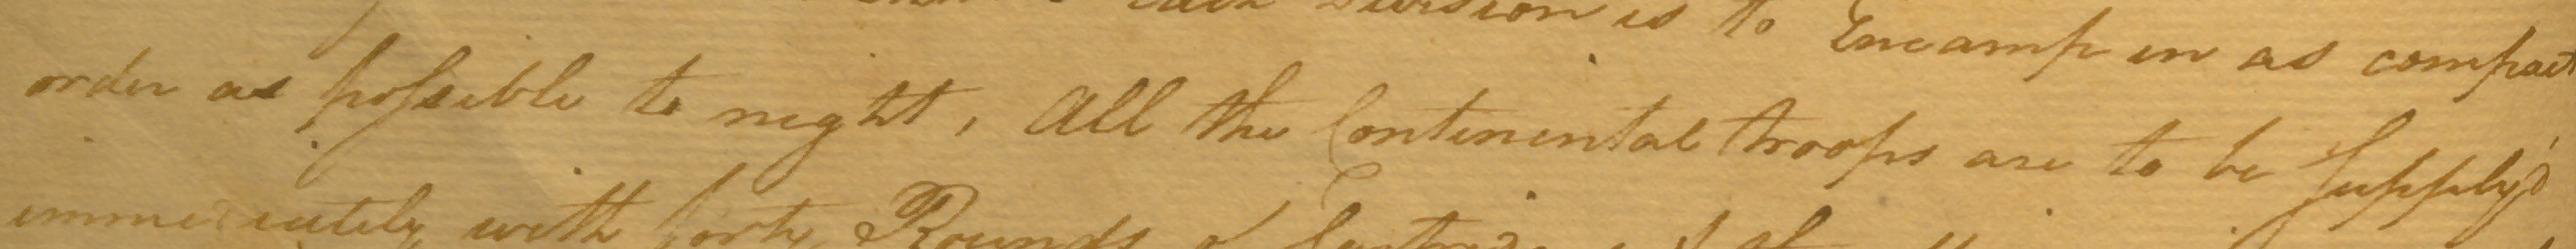order as possible to night. All the Continental troops are to be Supply'd
